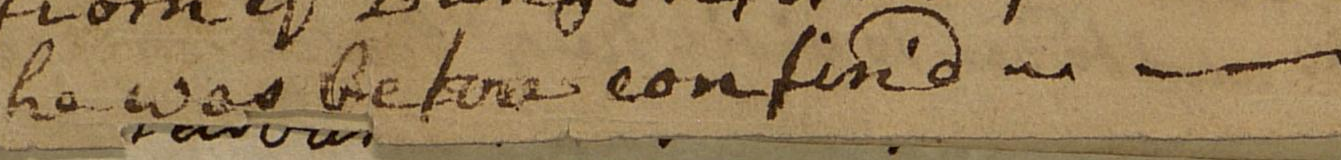he was before confin'd -
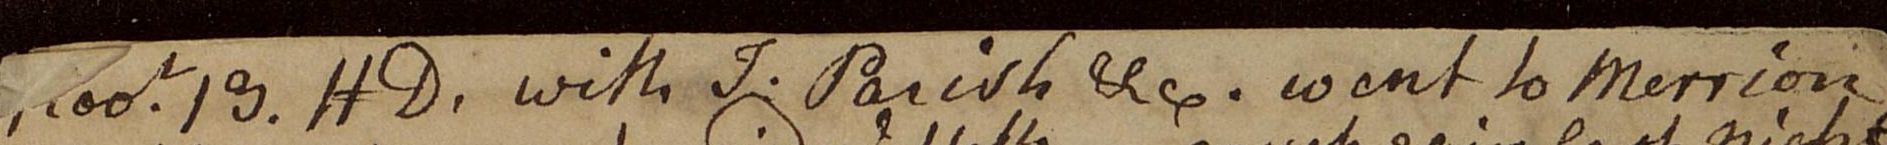ev^t. 1 3. t Dr with S Parish Ec. went to Merrion
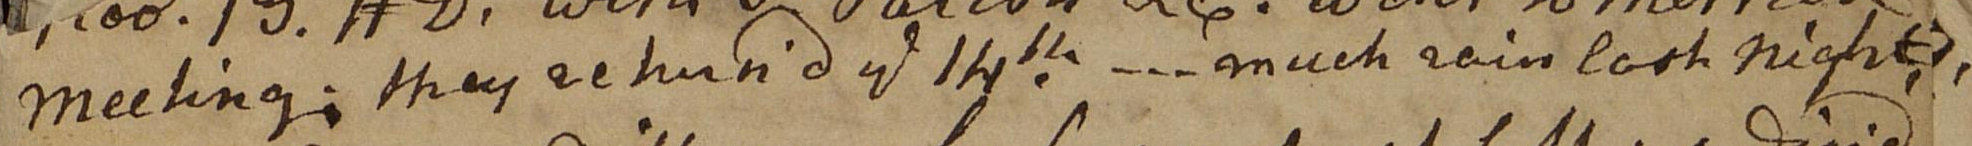meeting; they return'd y^e 14^th.--- much rain last night,
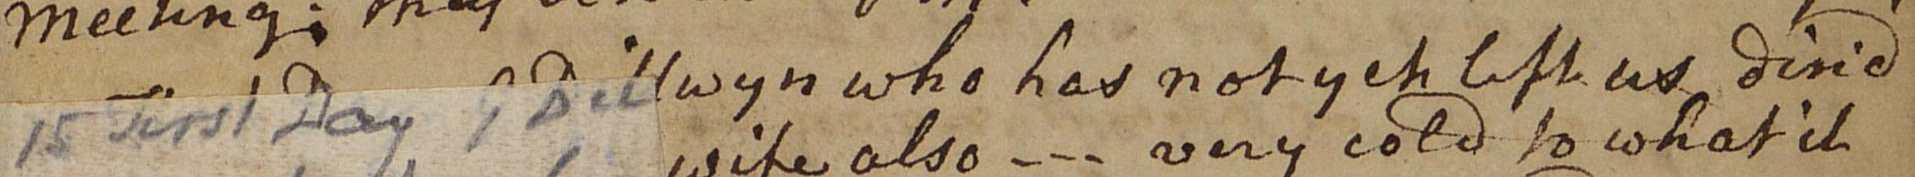15 First Day [_] Dillwyn who has not yet left us din'd
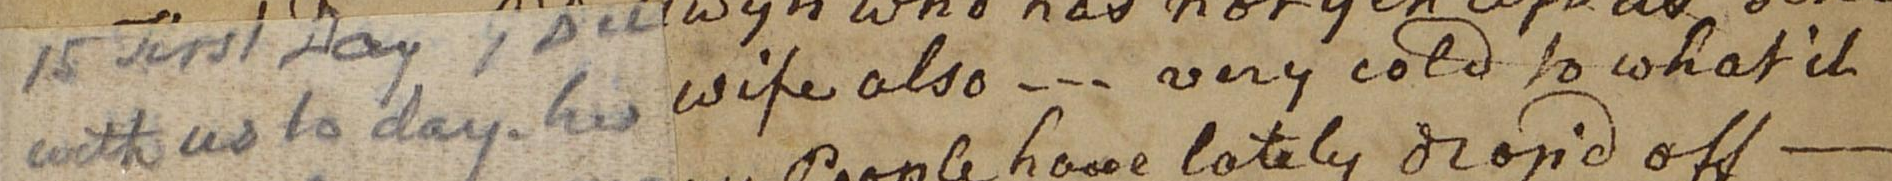with us to day. his wife also--- very cold to what it
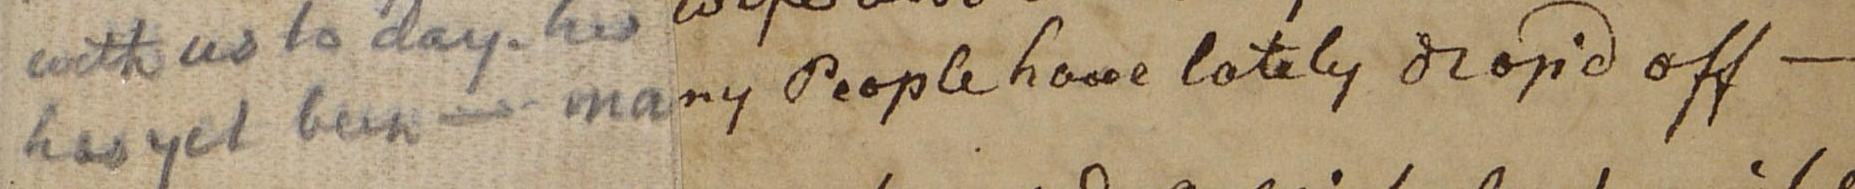has yet been- many People have lately drop'd off-
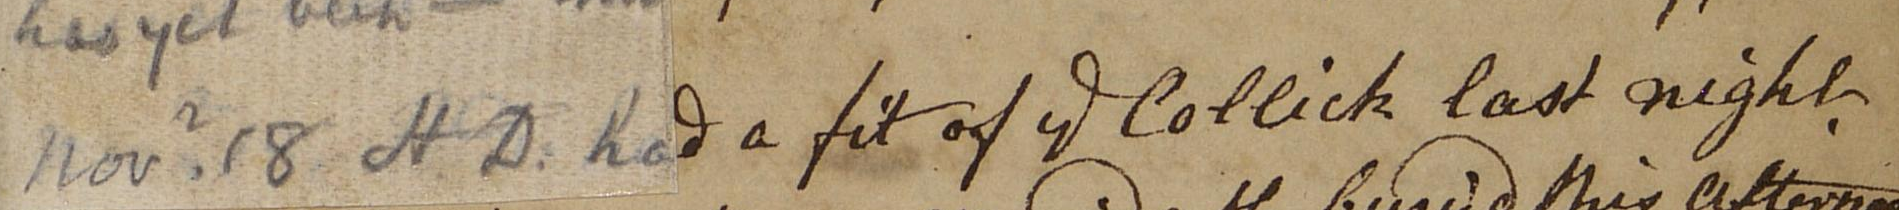Nov^r. 18 HD. had a fit of y^e Collick last night,
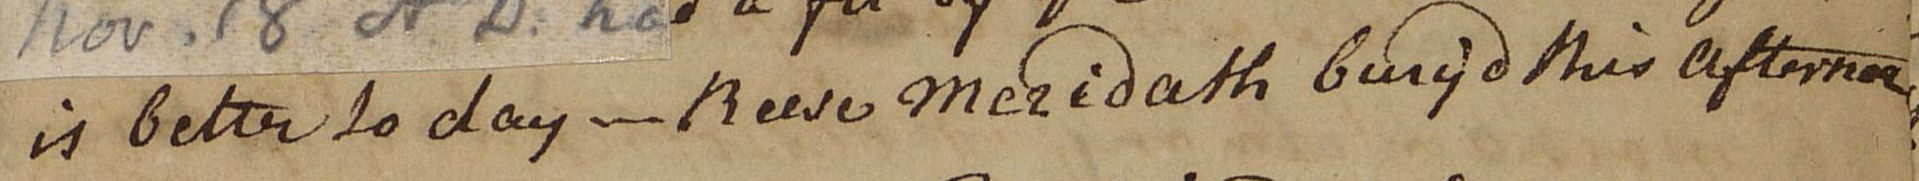is better to day- Reese Meridath bury'd this afternon
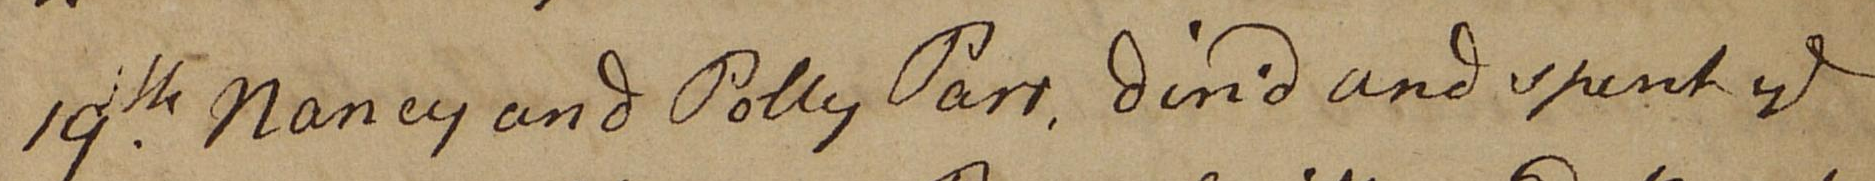19^th. Nancy and Polly Parr, din'd and spent y^e
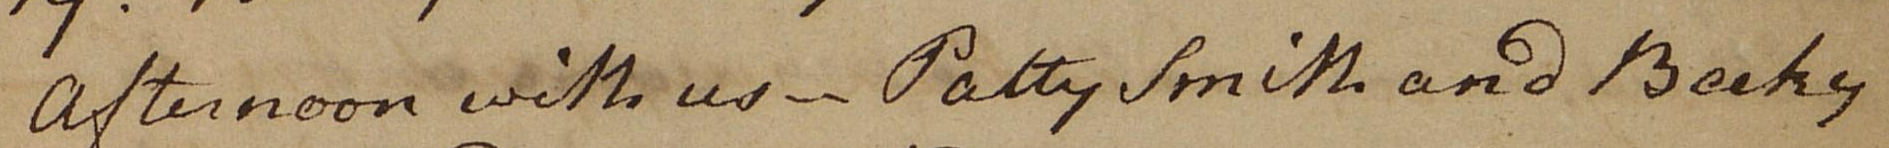Afternoon with us- Patty Smith and Becky
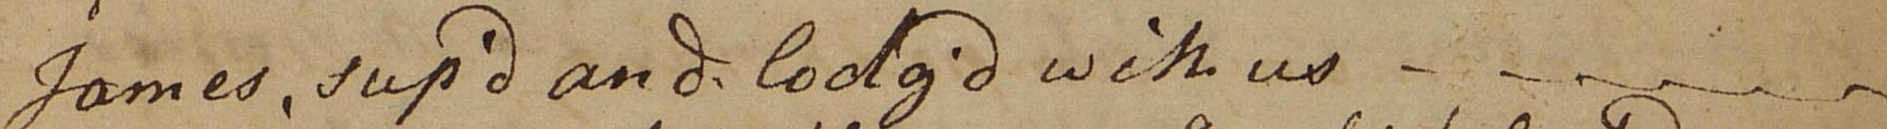James, sup'd and lodg'd with us-----
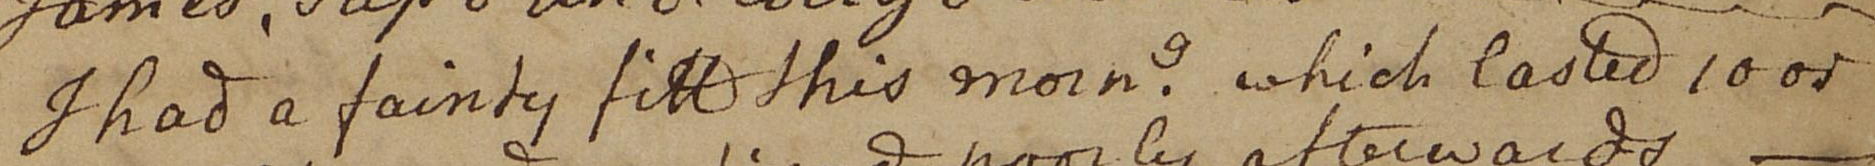I had a fainty fitt this morn^g. which lasted 10 or
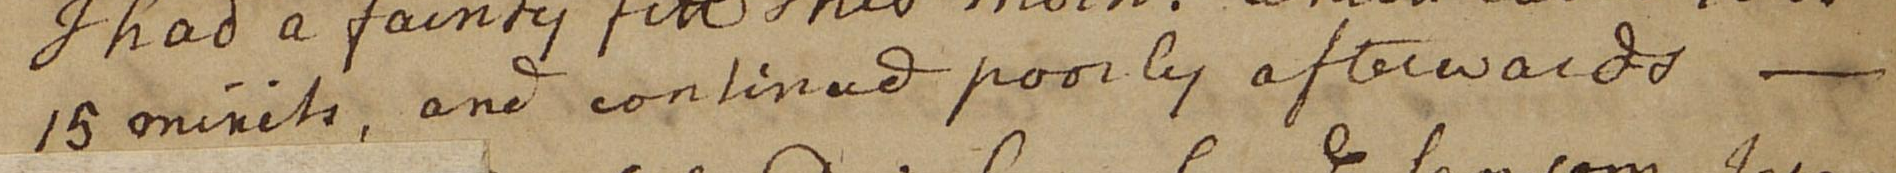15 minits, and continud poorly afterwards-
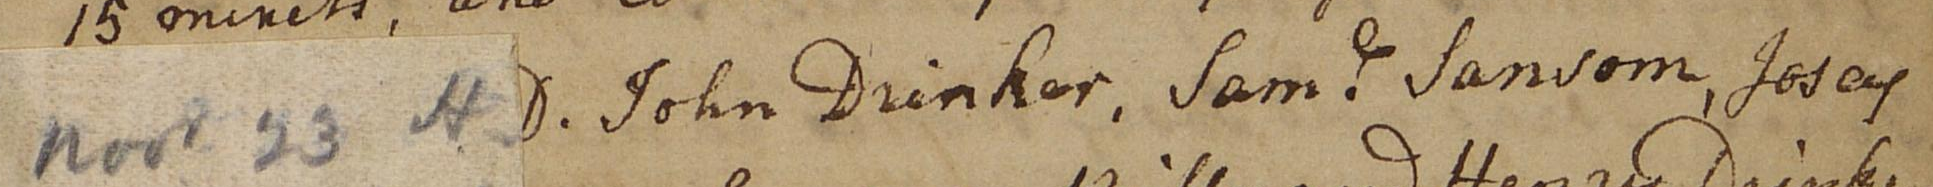nov^r. 23 HD. John drinker, Sam^l. Sansom, Josey
